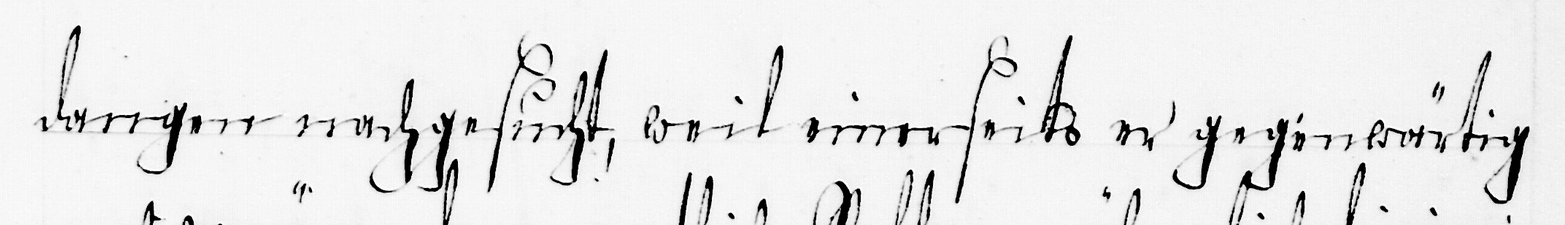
dangen nachgesucht, weil einerseits er gegenwärtig
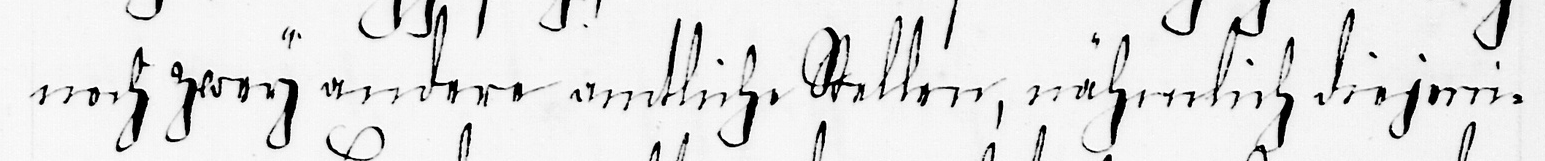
noch zwey andere amtliche Stellen, nähmlich diejeni¬
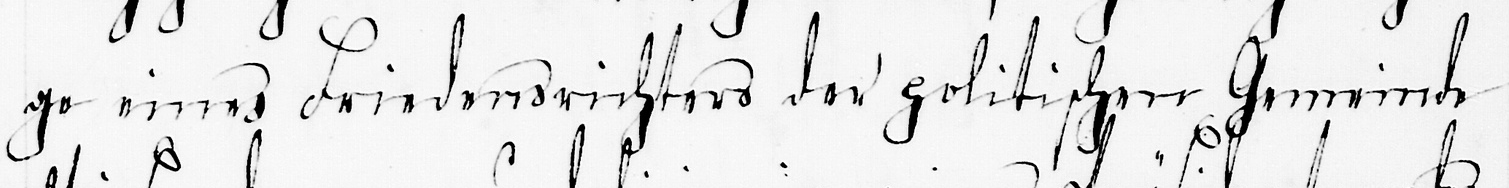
ge eines Friedensrichters der politischen Gemeinde
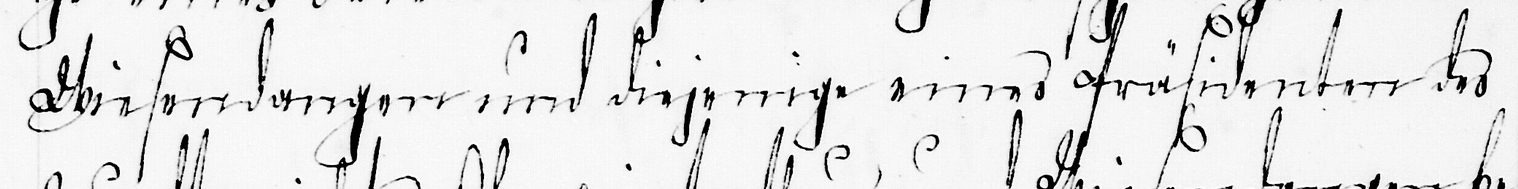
Wiesendangen und diejenige eines Präsidenten des
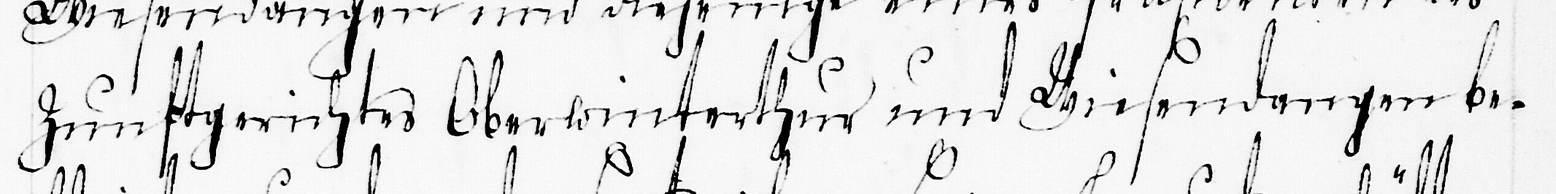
Zunftgerichtes Oberwinterthur und Wiesendangen be¬
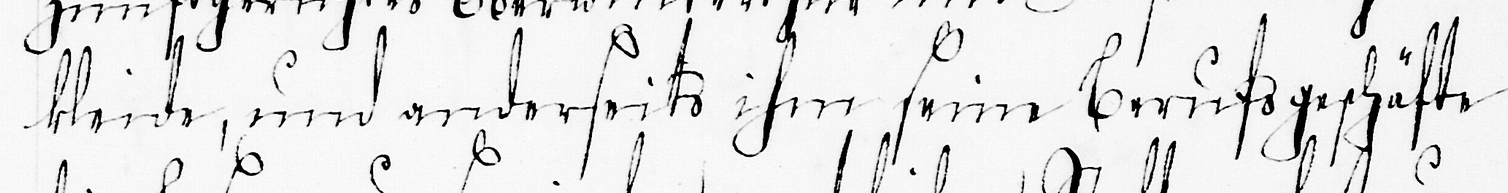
kleide, und anderseits ihm seine Berufsgeschäfte
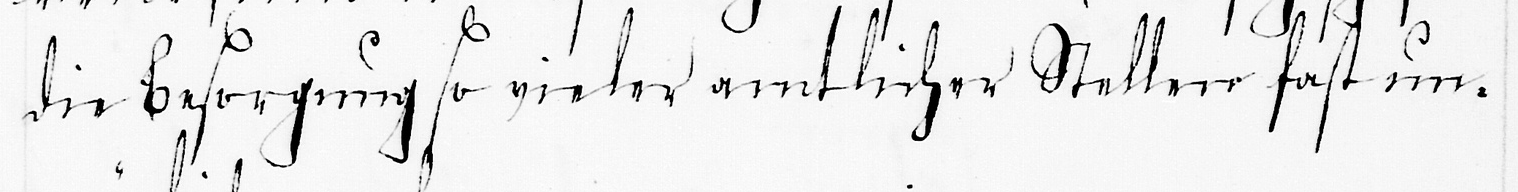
die Besorgung so vieler amtlicher Stellen fast un¬
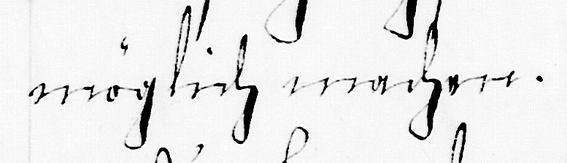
möglich machen.
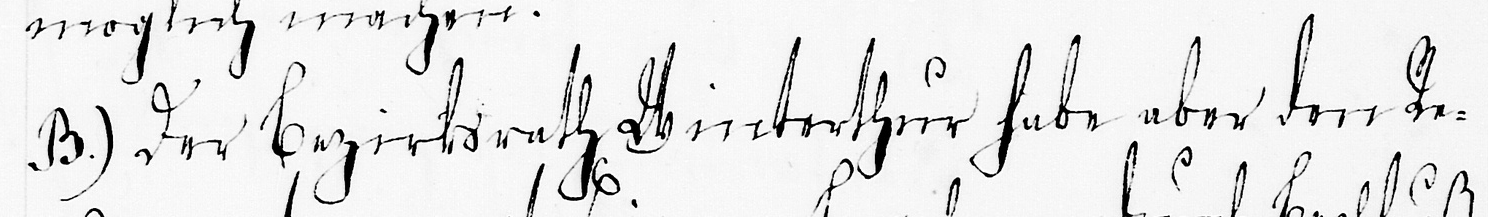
B.) Der Bezirksrath Winterthur habe aber den Re¬
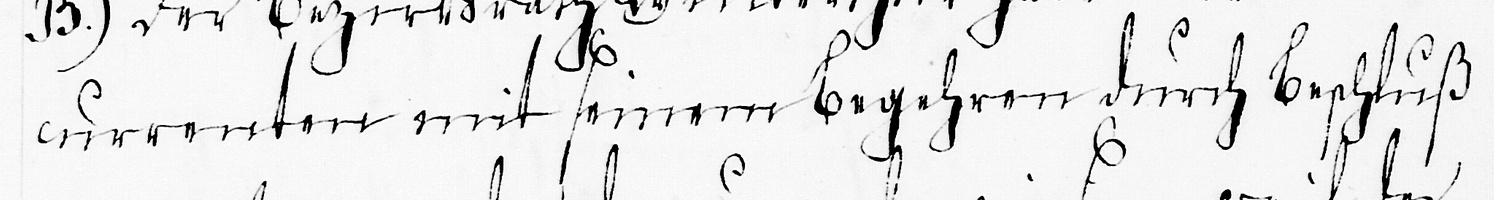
currenten mit seinem Begehren durch Beschluß
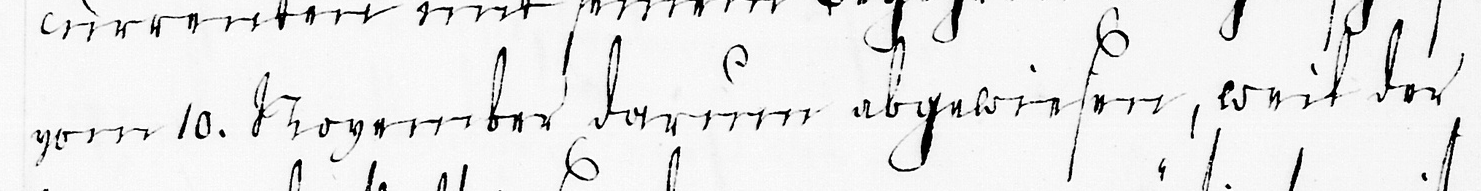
vom 10. November darum abgewiesen, weil der
